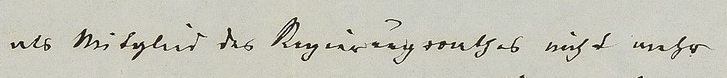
als Mitglied des Regierungsrathes nicht mehr
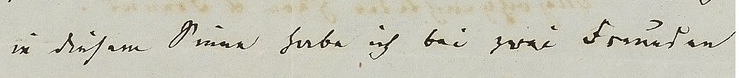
in diesem Sinne habe ich bei zwei Freunden
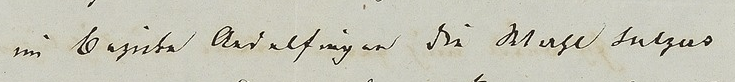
im Bezirke Andelfingen die Wahl Sulzers
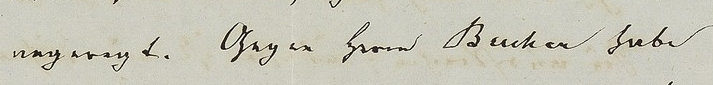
angeregt. Gegen Herrn Bucher habe
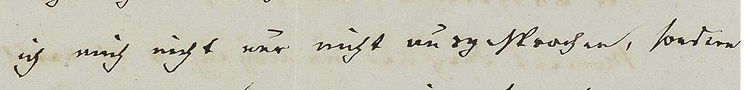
ich mich nicht nur nicht ausgesprochen, sondern
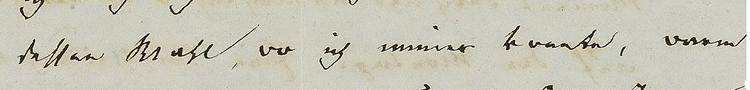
dessen Wahl, wo ich immer konnte, warm
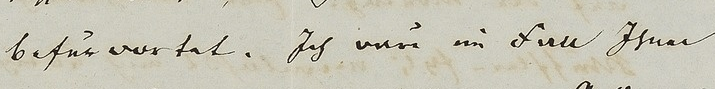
befürwortet. Ich wäre im Fall Ihnen
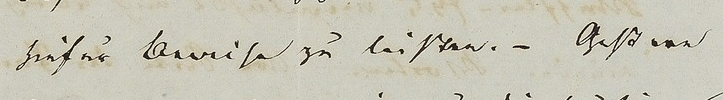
hiefür Beweise zu leisten. – Gestern
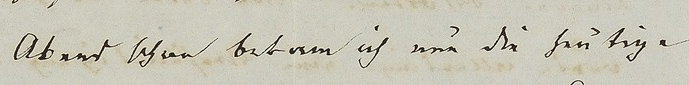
Abend schon bekam ich nun die heutige
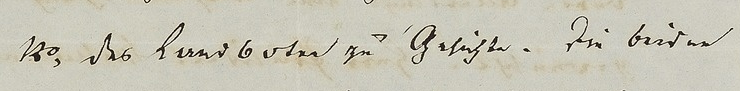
No des Landboten zu Gesichte. Die beiden
